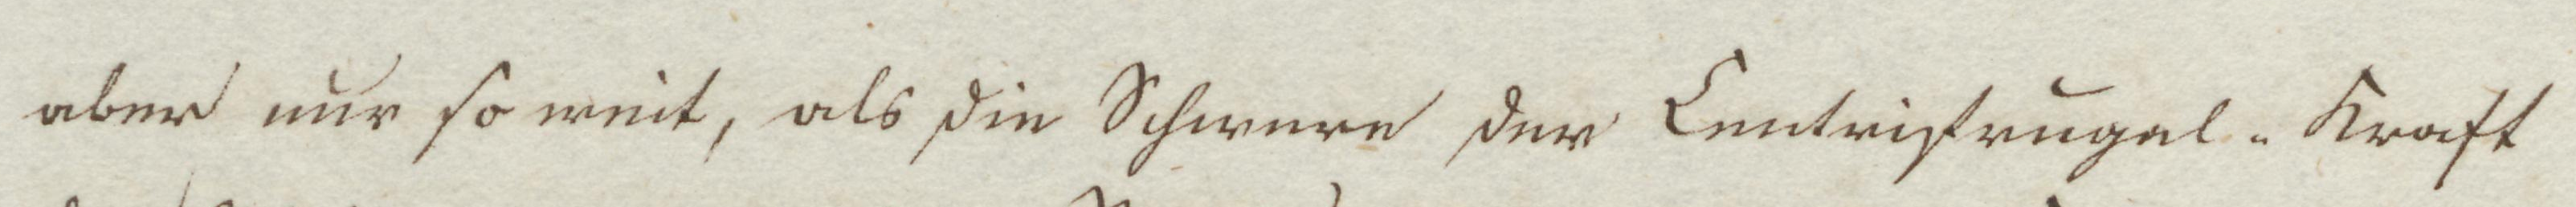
aber nur so weit, als die Schwere der Centrifrugal-Kraft
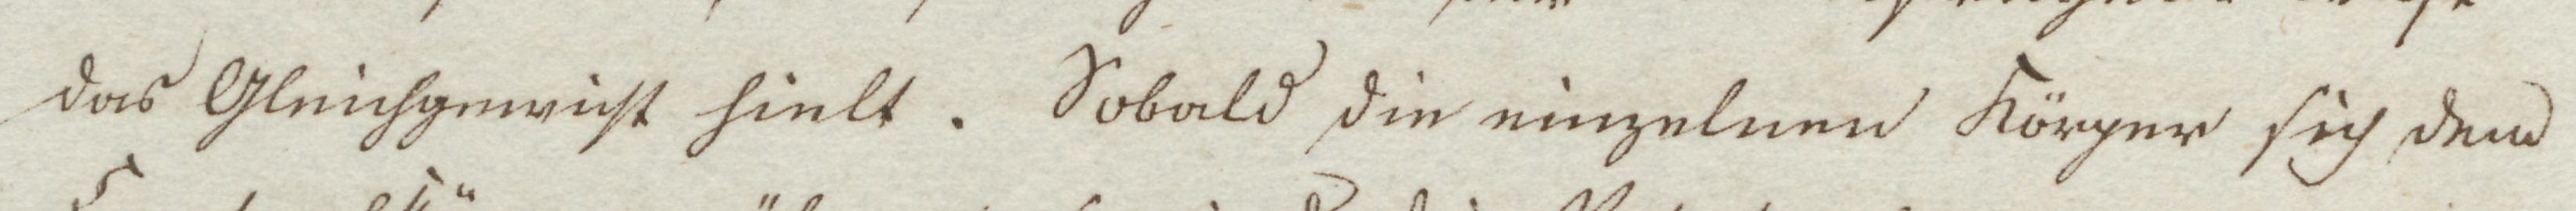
das Gleichgewicht hielt. Sobald die einzelnen Körper sich dem
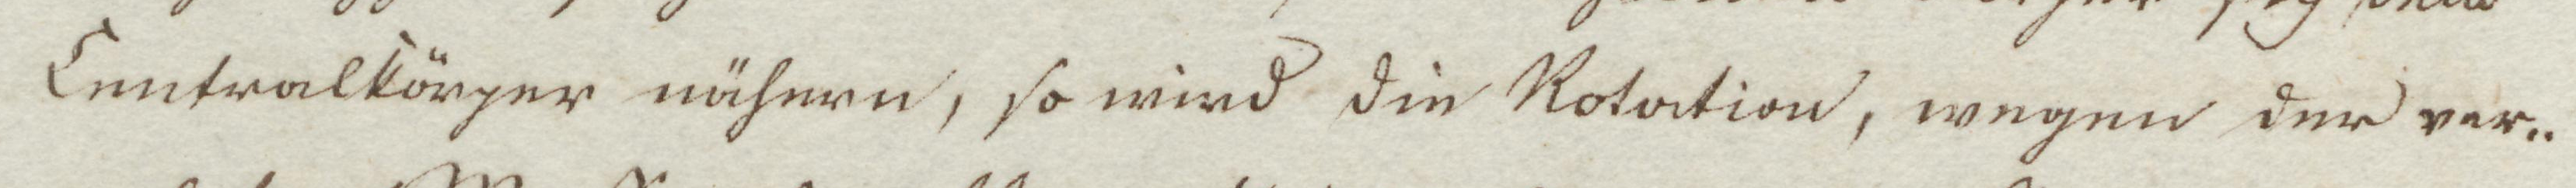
Centralkörper nähern, so wird die Rotation, wegen der ver-
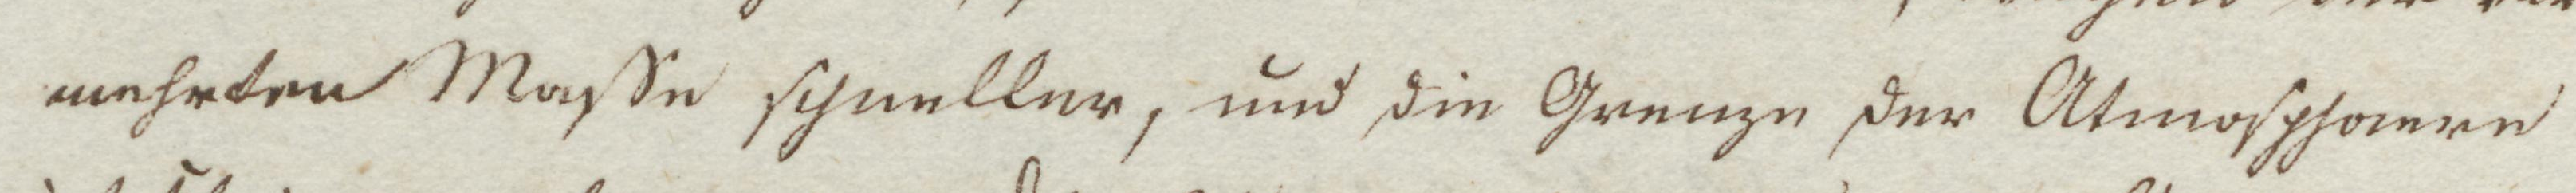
mehrten Masse schneller, und die Grenze der Atmosphaere
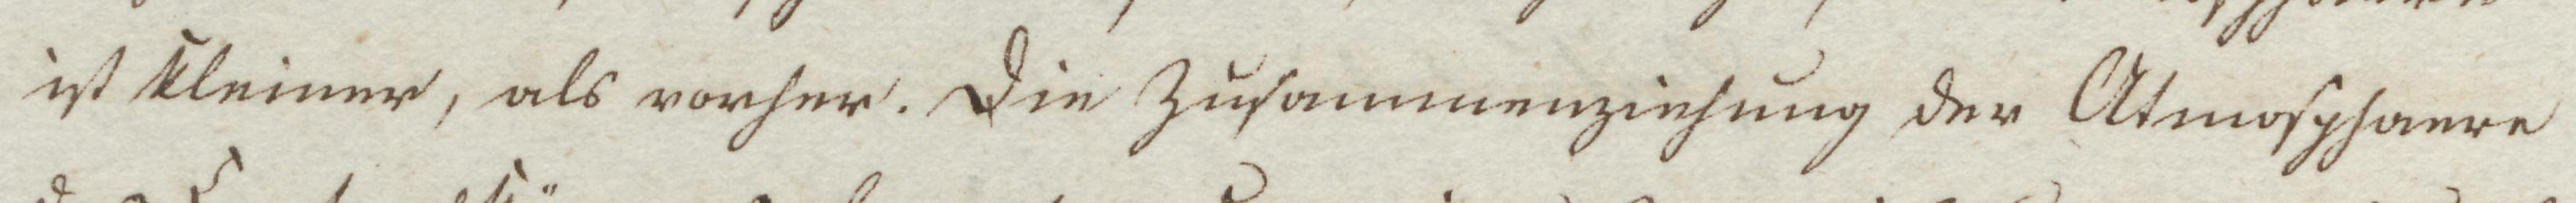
ist kleiner, als vorher. Die Zusammenziehung der Atmosphaere
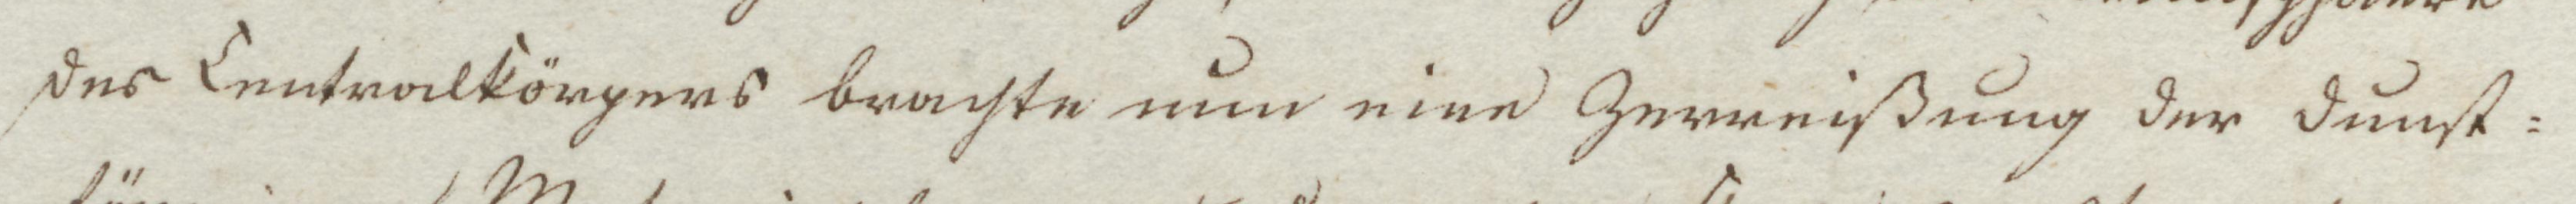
des Centralkörpers brachte nun eine Zerreißung der dunst-
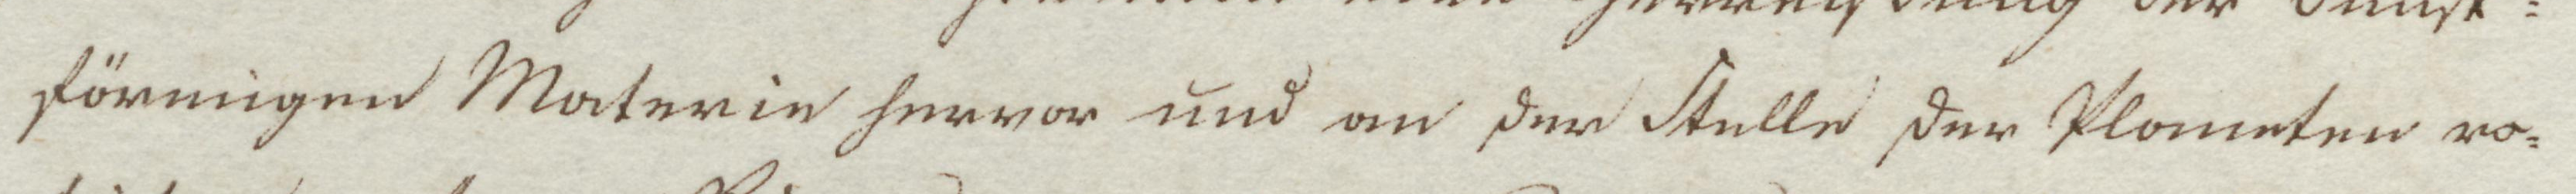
förmigen Materie hervor und an der Stelle der Planeten ro-
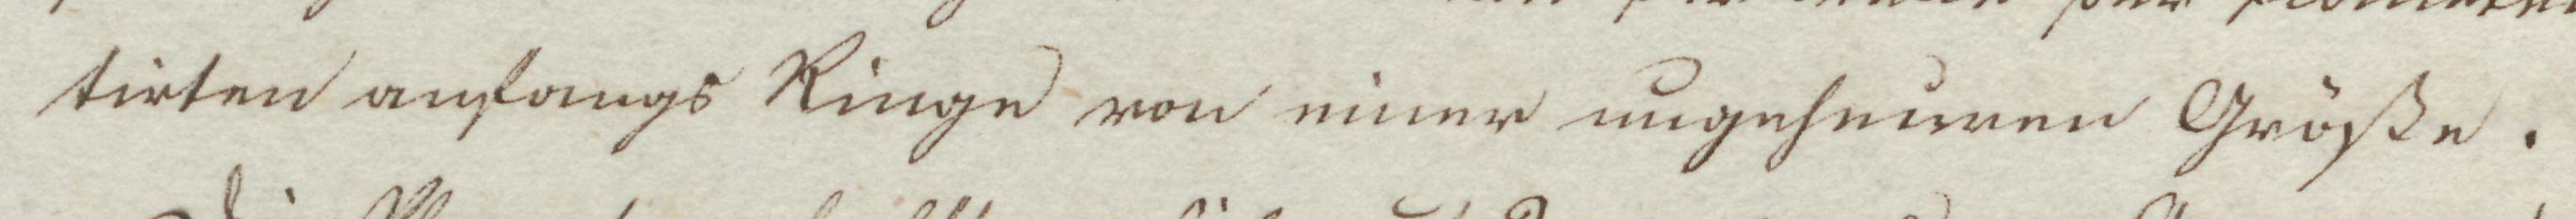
tirten anfangs Ringe von einer ungeheuren Größe.
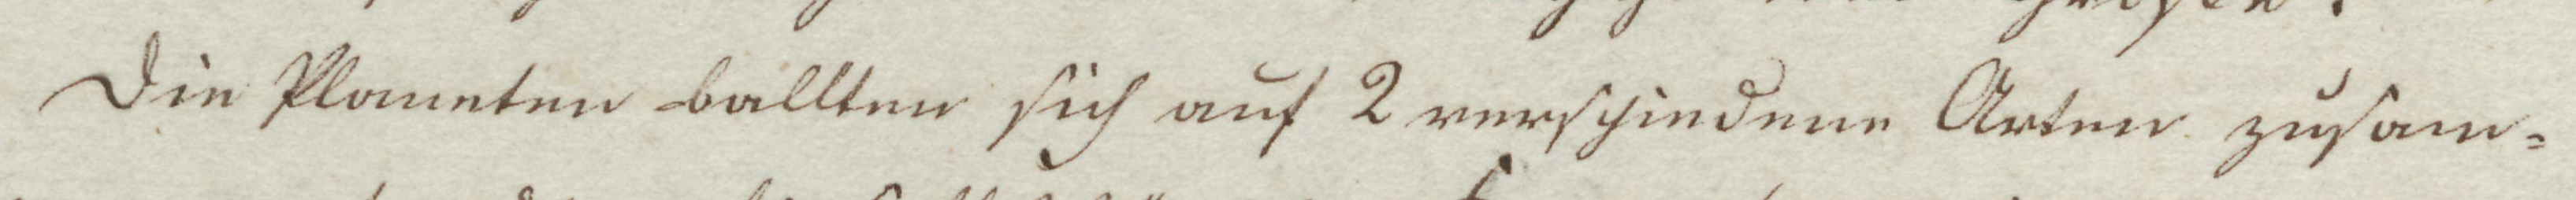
Die Planeten ballten sich auf 2 verschiedene Arten zusam-
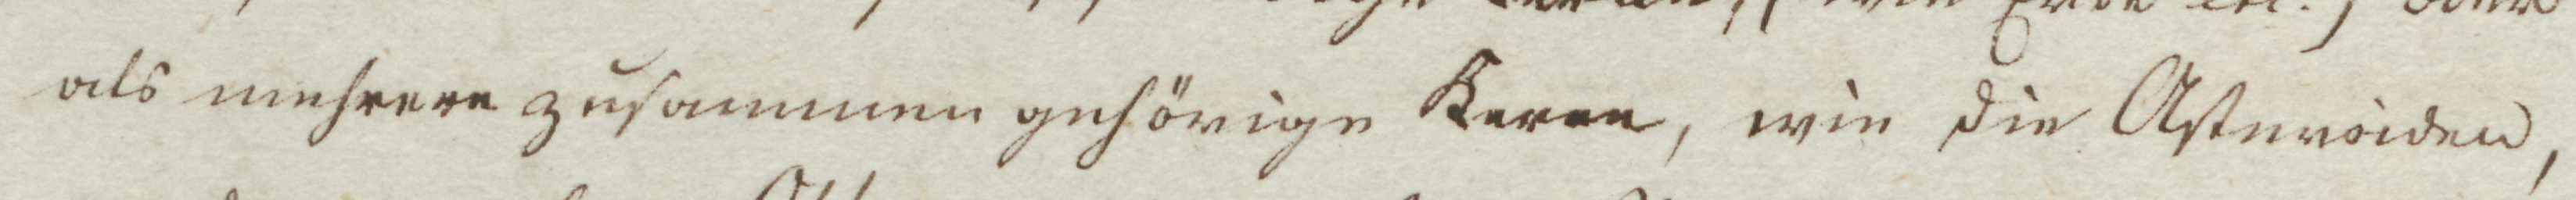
als mehrere zusammen gehörige Kerne, wie die Asteroiden,
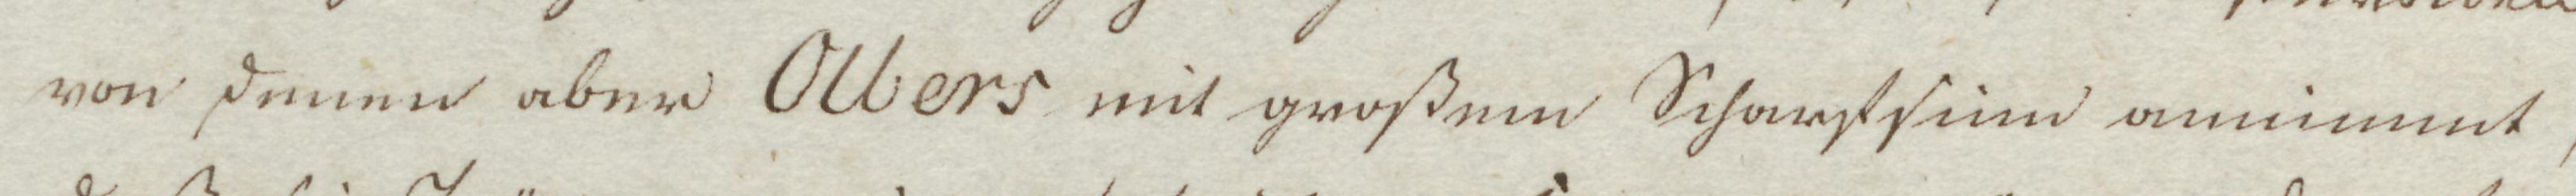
von denen aber Olbers mit großem Scharfsinn annimmt,
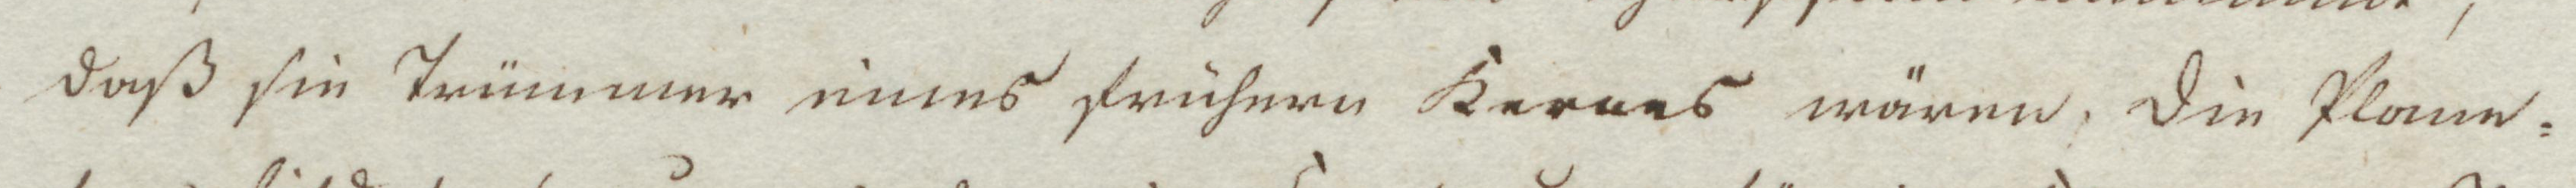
daß sie Trümmer eines frühern Kernes wären. Die Plane-
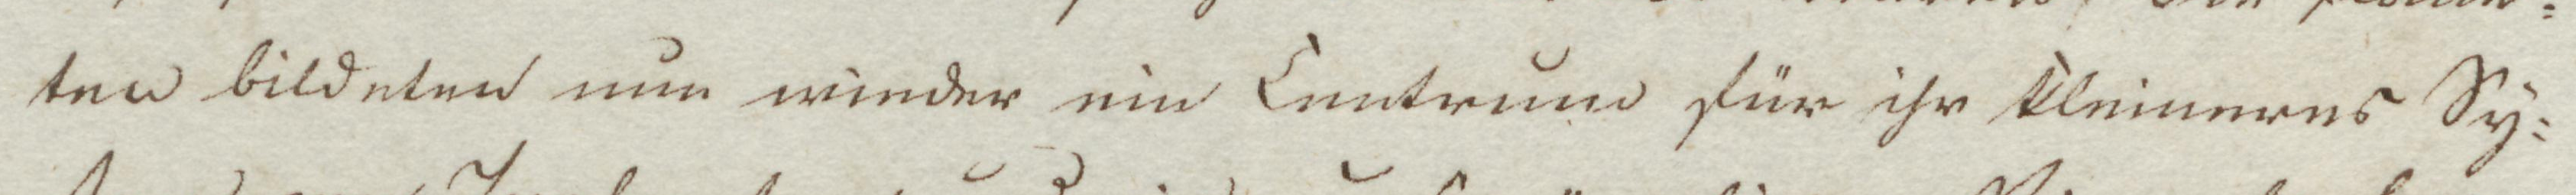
ten bildeten nun wieder ein Centrum für ihr kleineres Sÿ-
